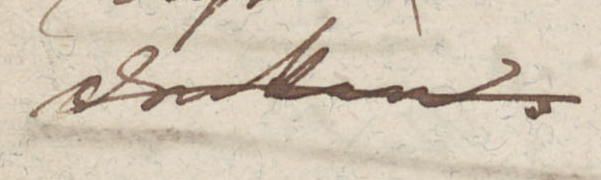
denken.
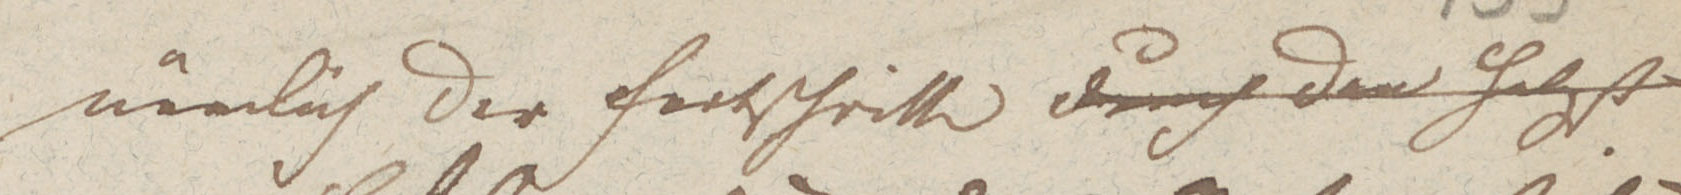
nämlich der Fortschritt durch den Holzst
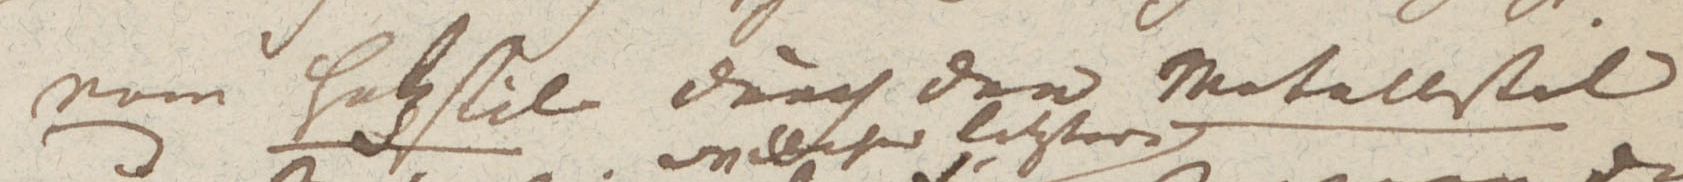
vom Holzstil durch den Metallstil
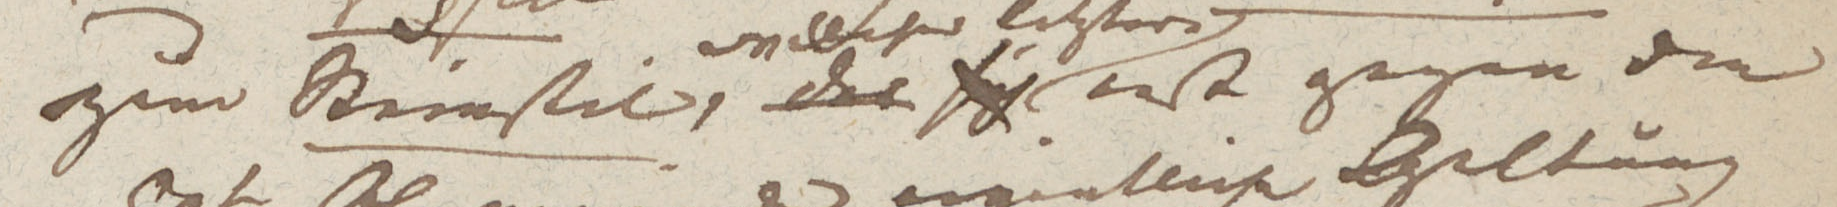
zum Steinstil, der sich welcher letztere erst gegen die
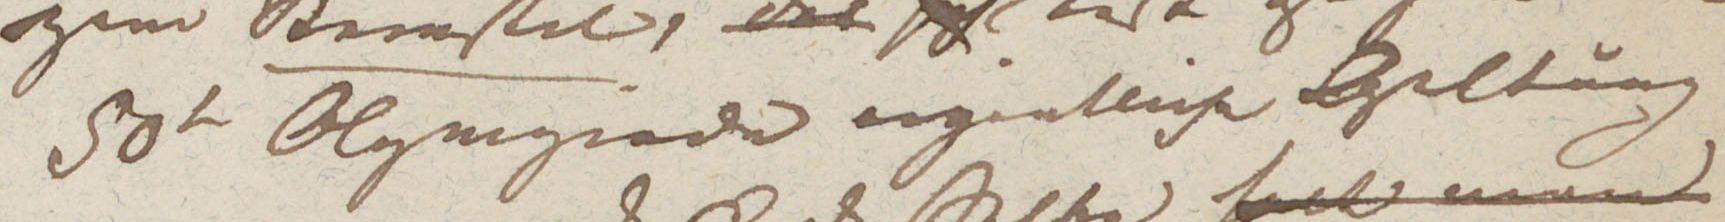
50t Olympiade eigentliche Geltung
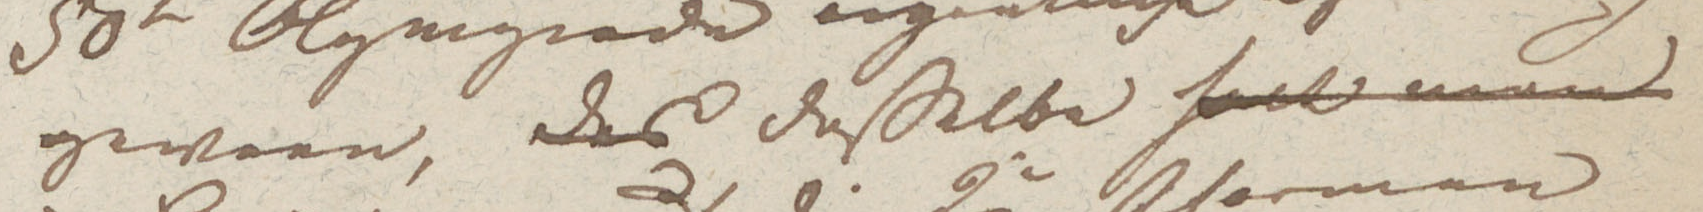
gewann, das dasselbe halt man
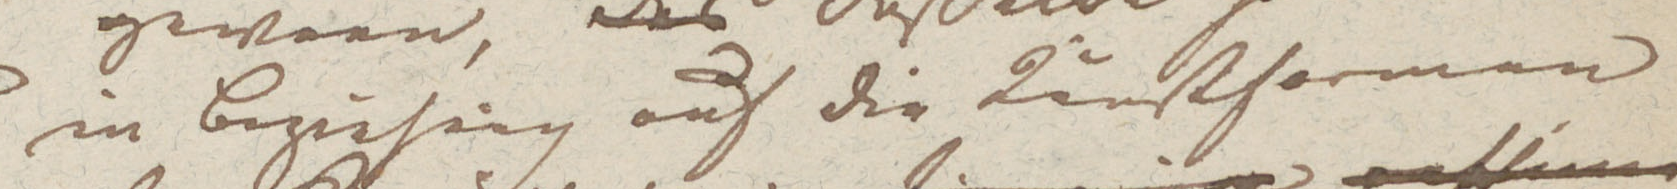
in Beziehung auf die Kunstformen
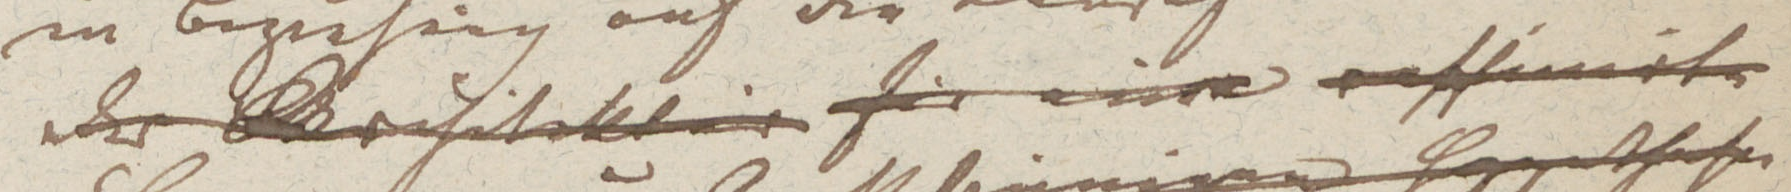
der Architektur für eine raffinirte
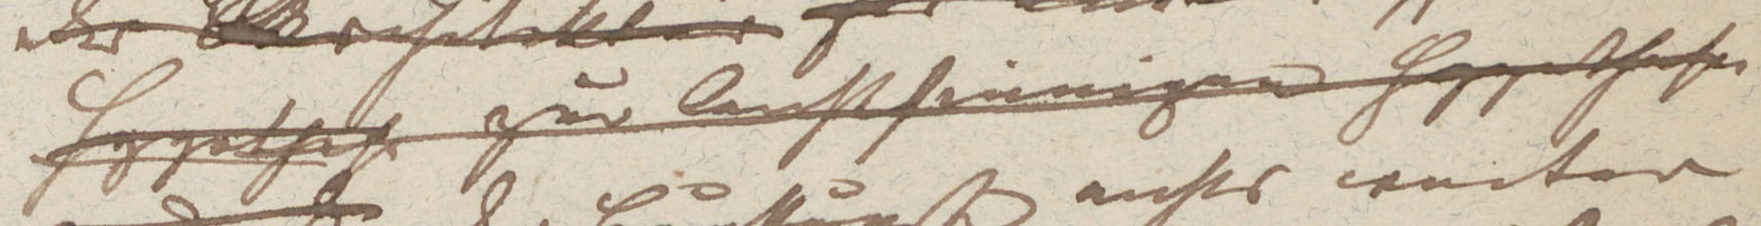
Hypothese zur leichtsinnigen Hypothese
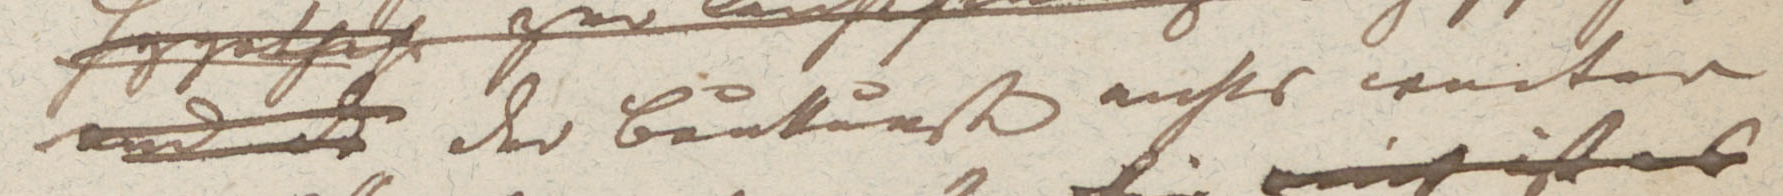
und d der Baukunst nichts weiter
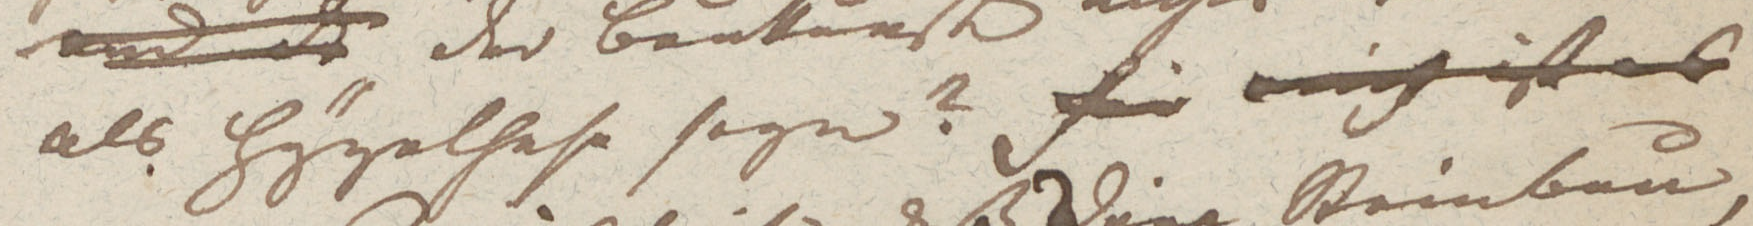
als Hypolhese seyn? Für mich ist es
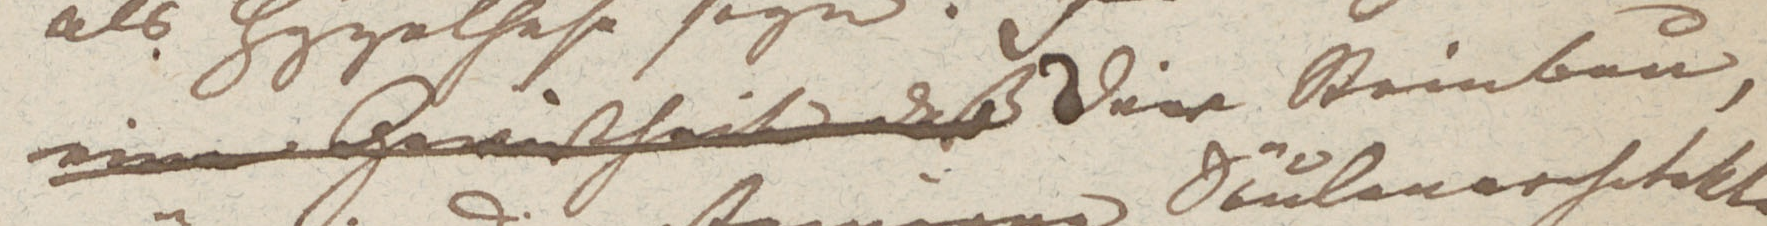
eine Gewissheit dass dieDer Steinbau,
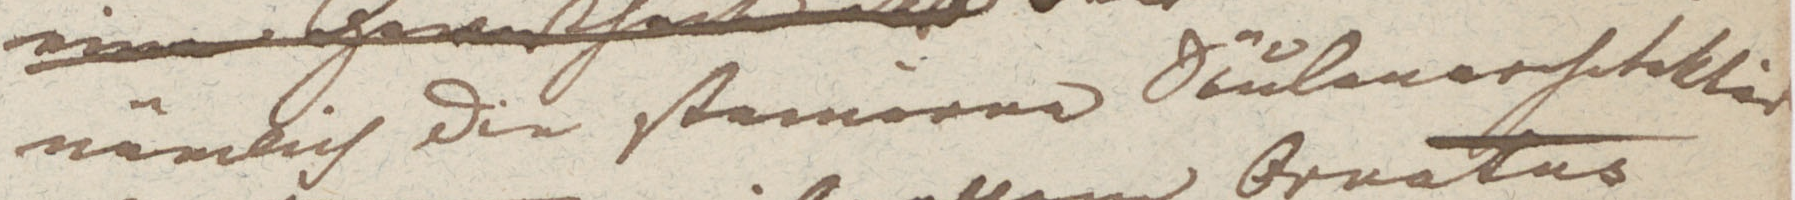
nämlich die steinerne Säulenarchitektur
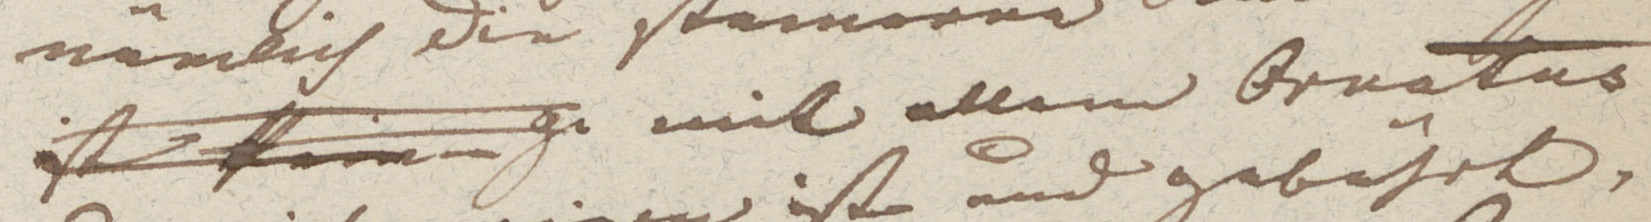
ist kein g mit allem Ornatus
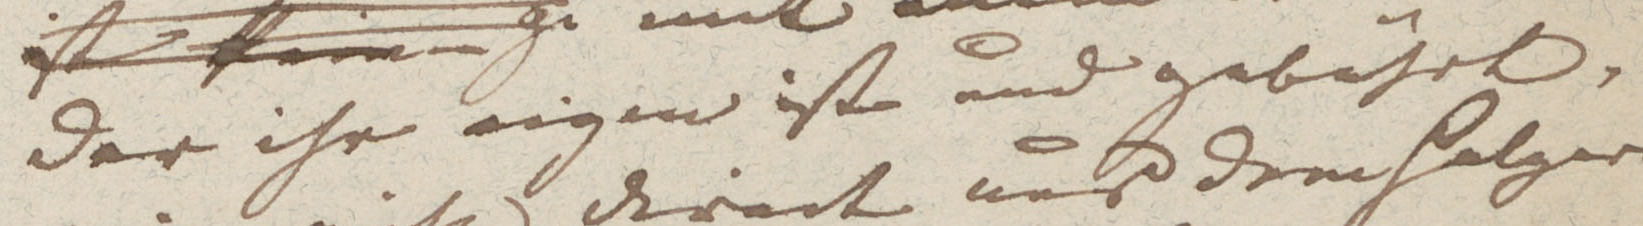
der ihr eigen ist und gebührt,
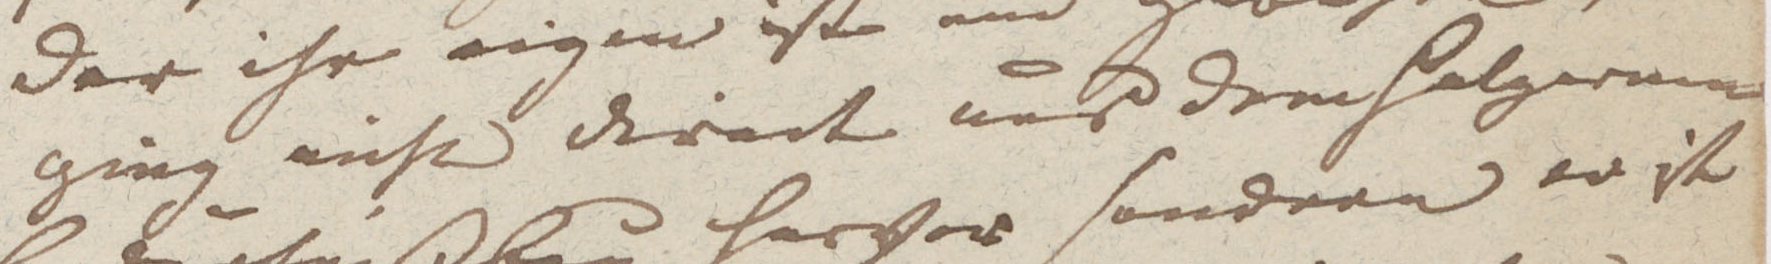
ging nicht direct aus dem holzernen
